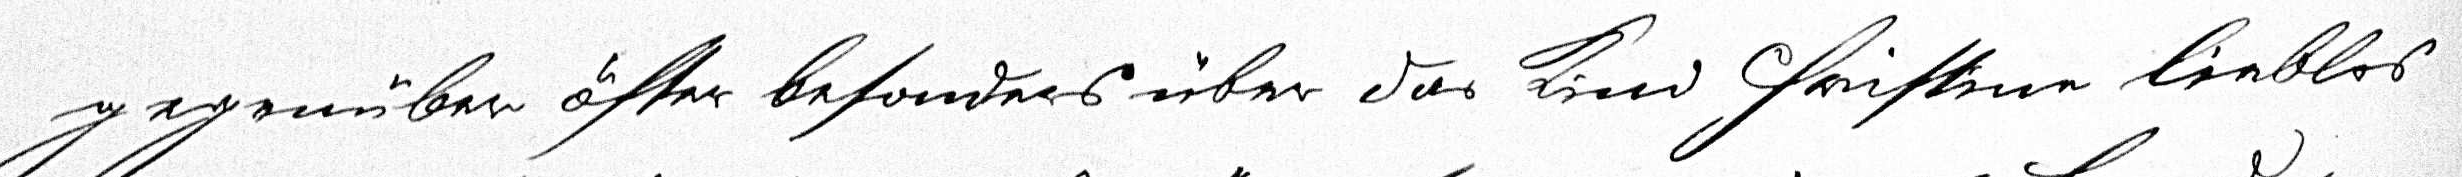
gegenüber öfter besonders über das Kind Christine lieblos
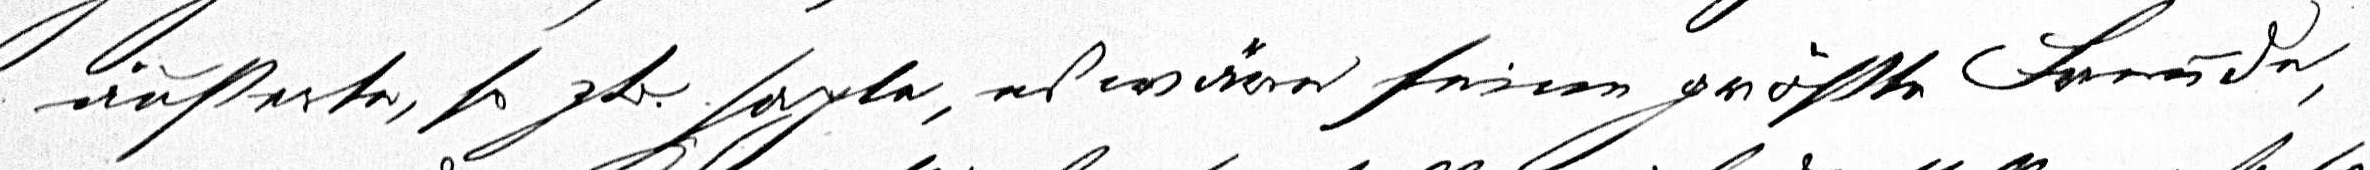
äußerte, so zB sagte, es wäre seine größte Freude,
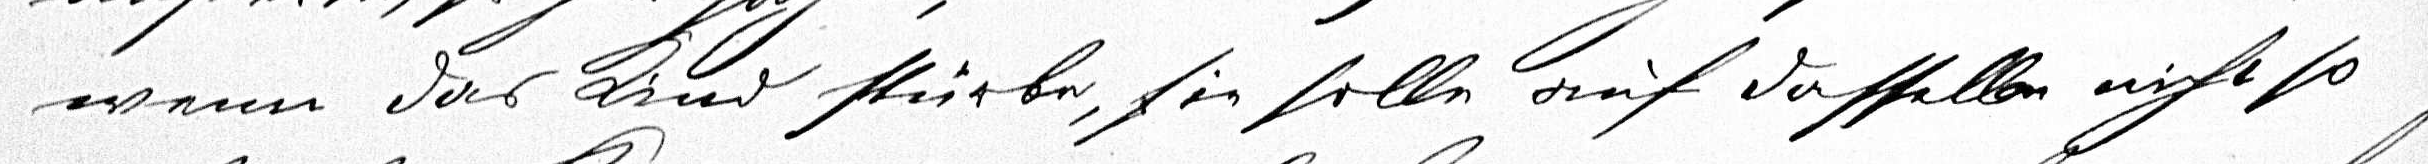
wenn das Kind stürbe, sie solle auf dasselbe nicht so
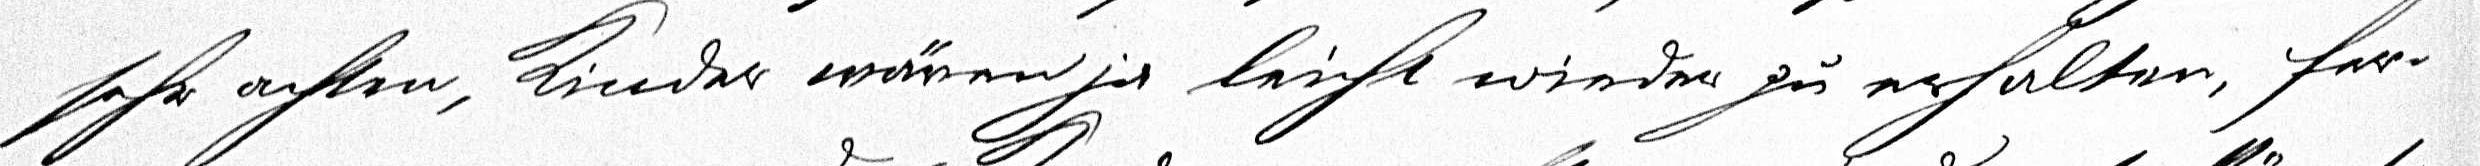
sehr achten, Kinder wären ja leicht wieder zu erhalten, fer¬
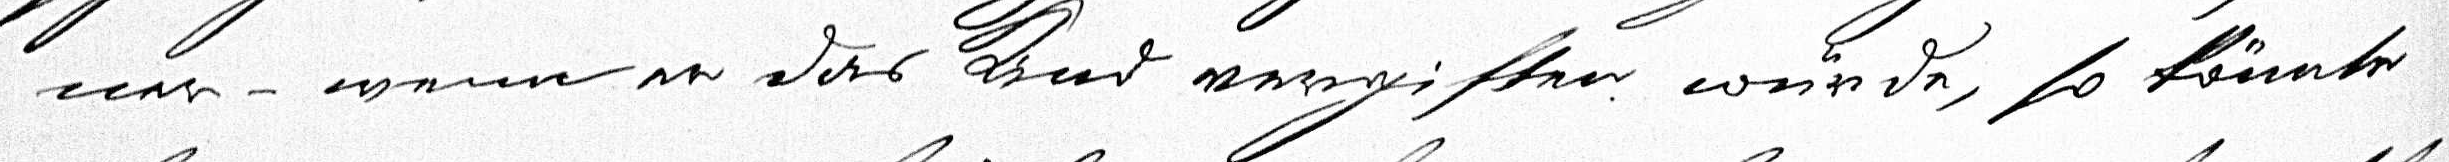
ner – wenn er das Kind vergiften würde, so könnte
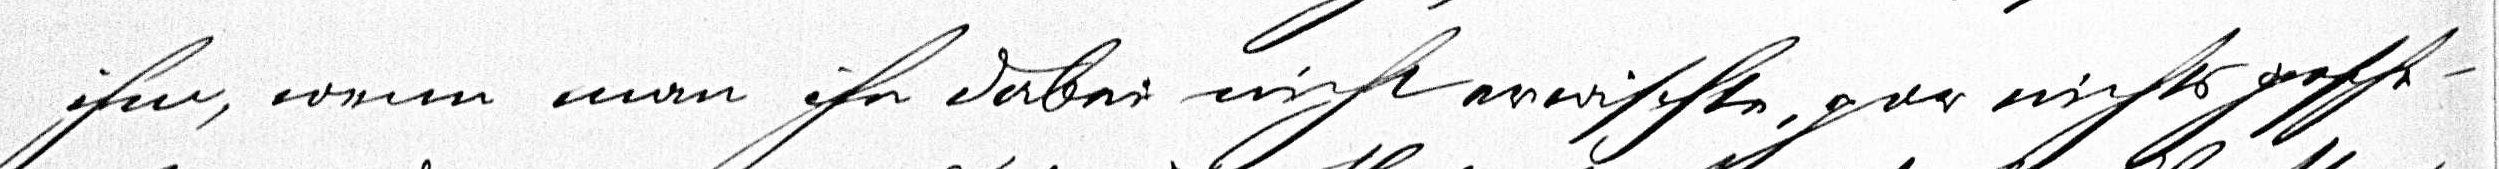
ihm, wenn man ihn dabei nicht erwischte, gar nicht gesche¬
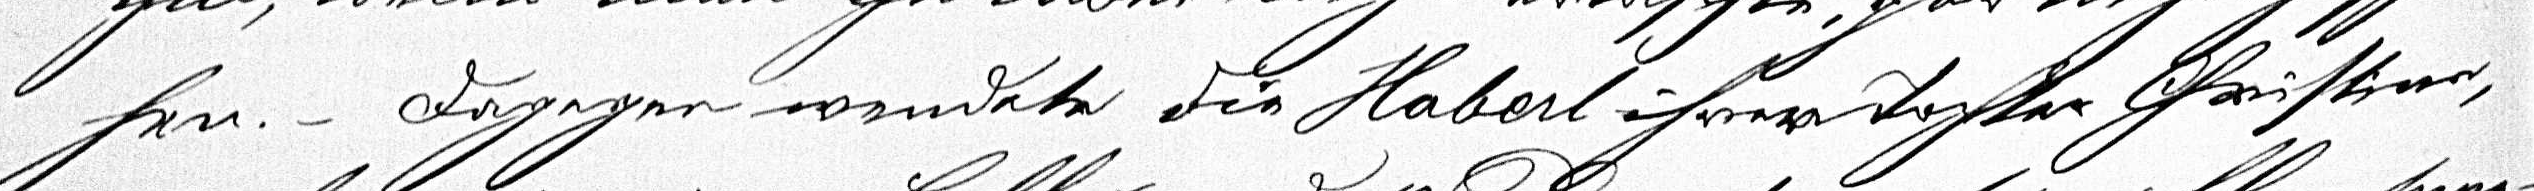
hen. Dagegen wendete die Haberl ihrer Tochter Christine
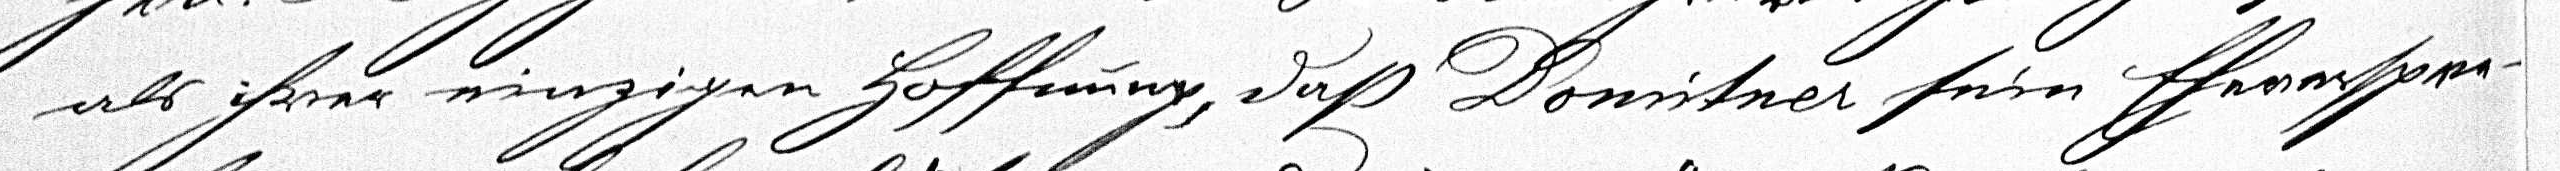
als ihrer einzigen Hoffnung, daß Domitner sein Eheverspre¬
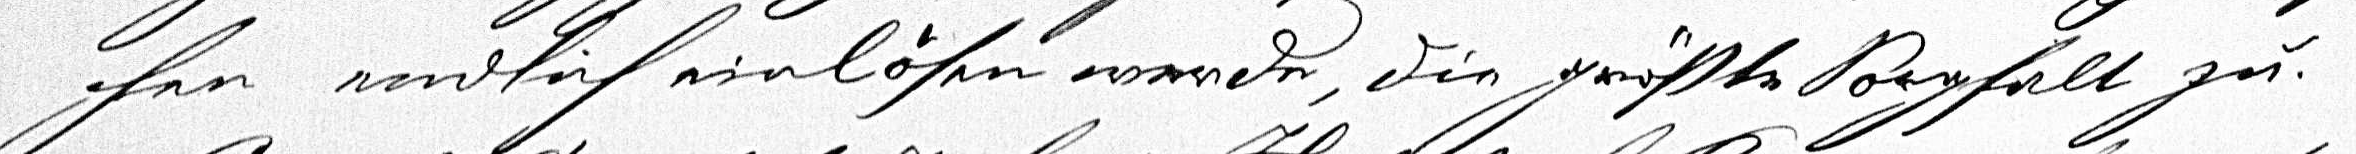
chen endlich einlösen werde, die größte Sorgfalt zu.
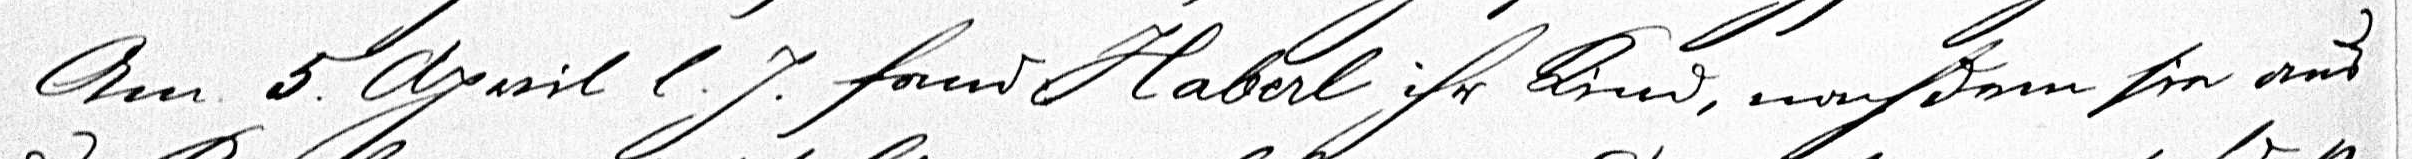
Am 5. April l. J. fand Haberl ihr Kind, nachdem sie aus
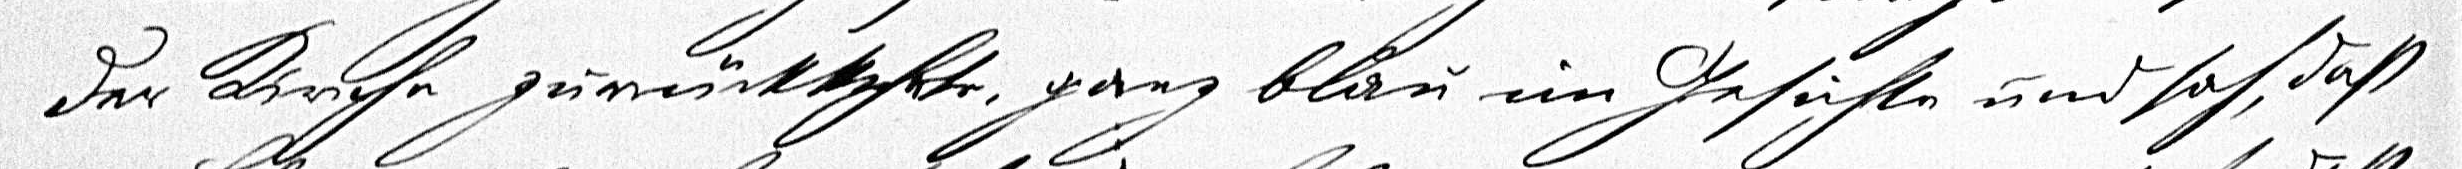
der Kirche zurückkehrte, ganz blau im Gesichte und sah, daß
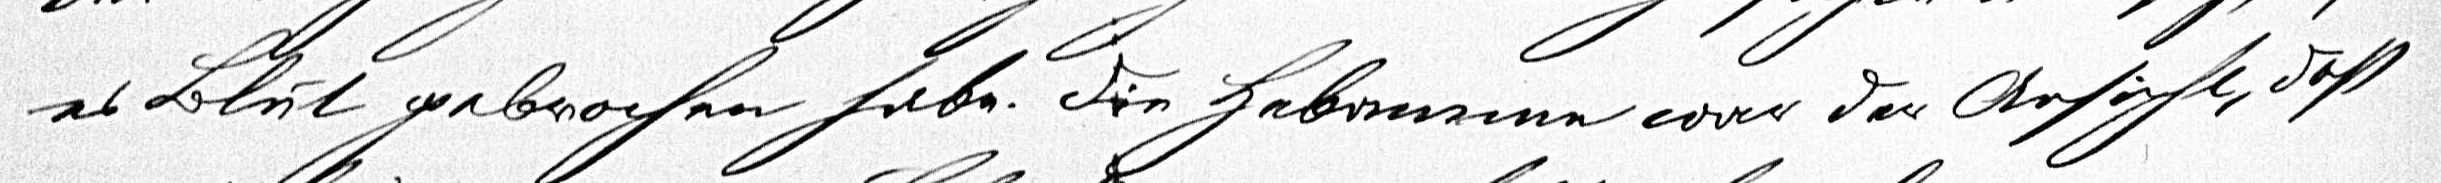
es Blut gebrochen habe. Die Hebamme war der Ansicht, daß
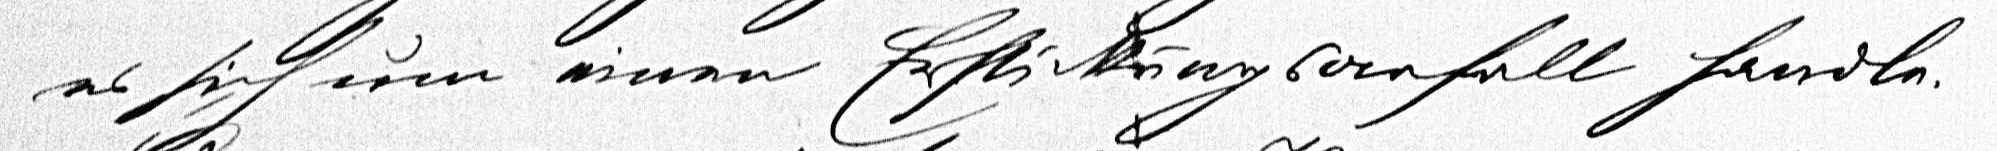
es sich um einen Erstickungsanfall handle.
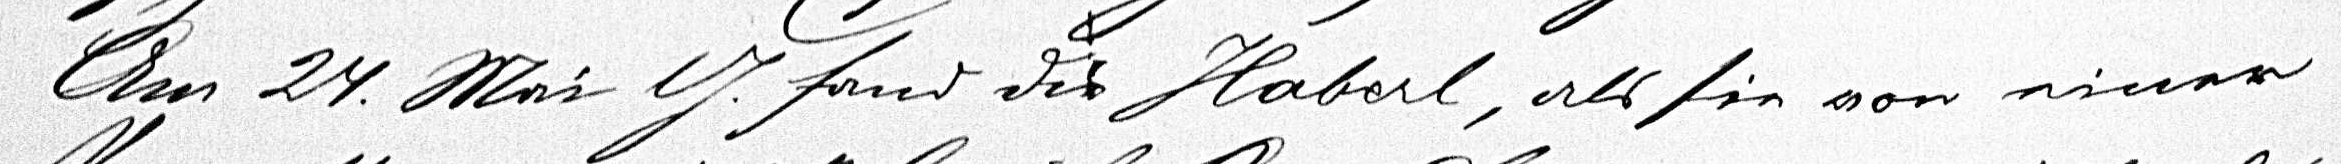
Am 24. Mai lJ fand die Haberl, als sie von einer
